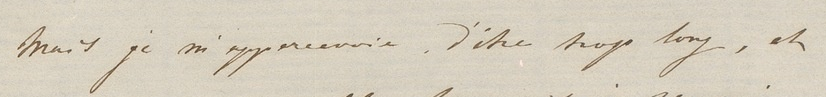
Mais je m'appercevoie, d'être trop long, et
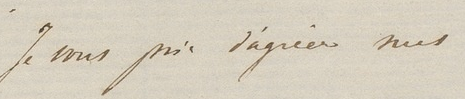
Je vous prie d'agréer mes
